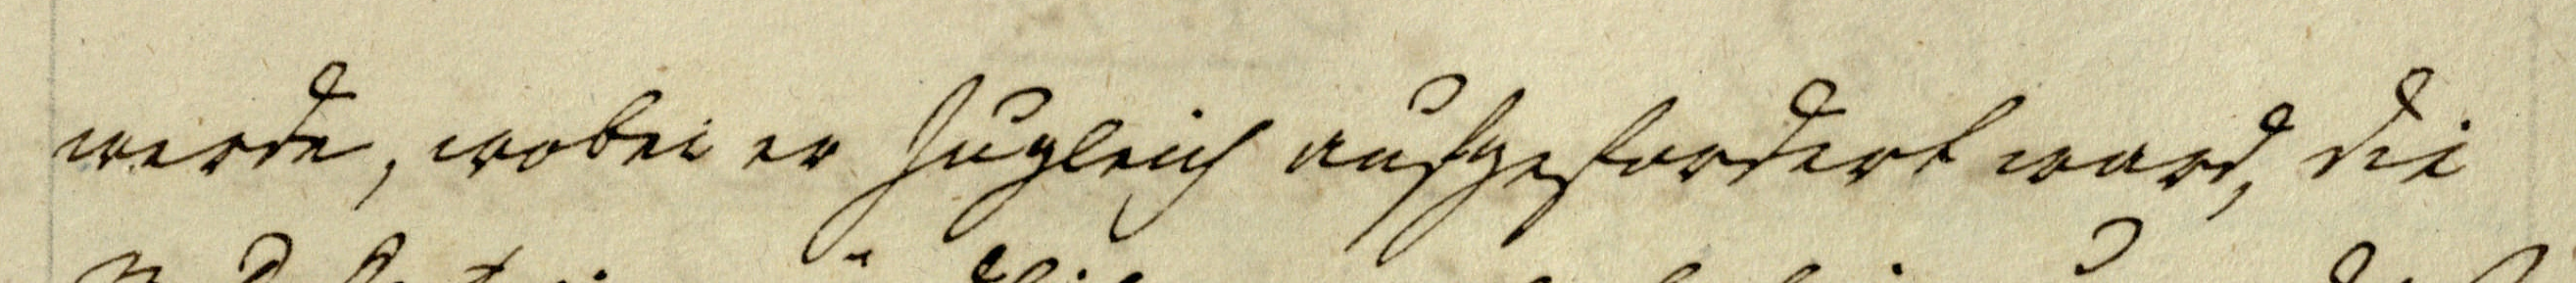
werde, wobei er zugleich aufgefordert ward, die
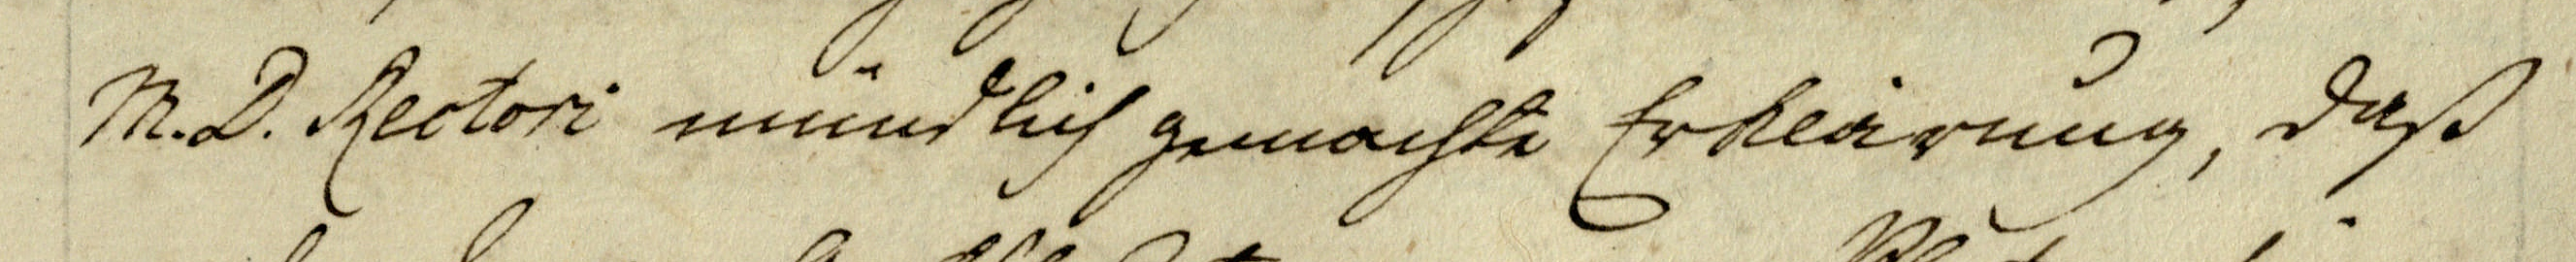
M. D. Rectori mündlich gemachte Erklärung, daß
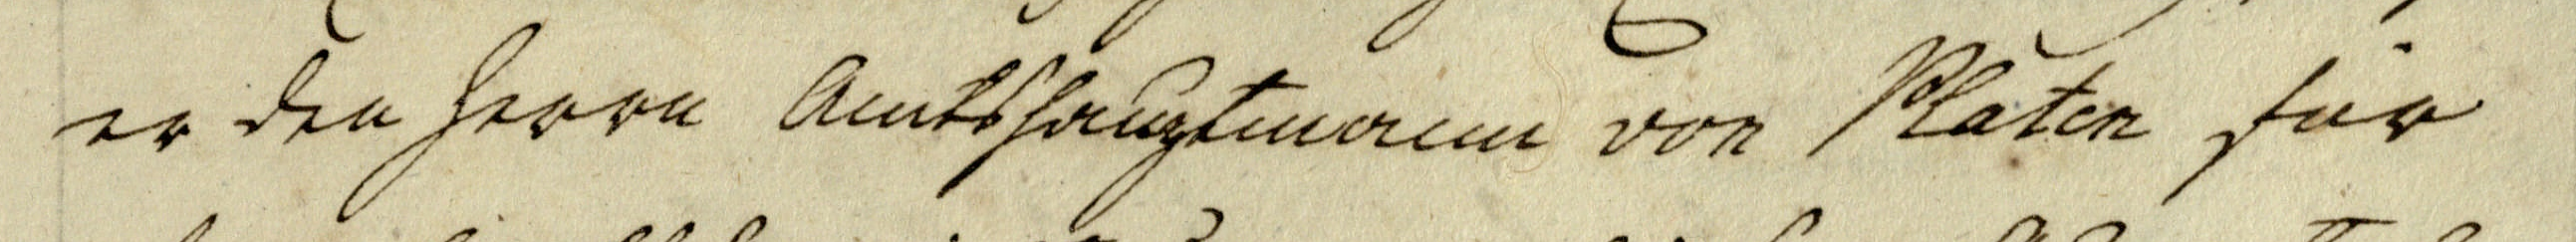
er den Herrn Amtshauptmann von Platen für
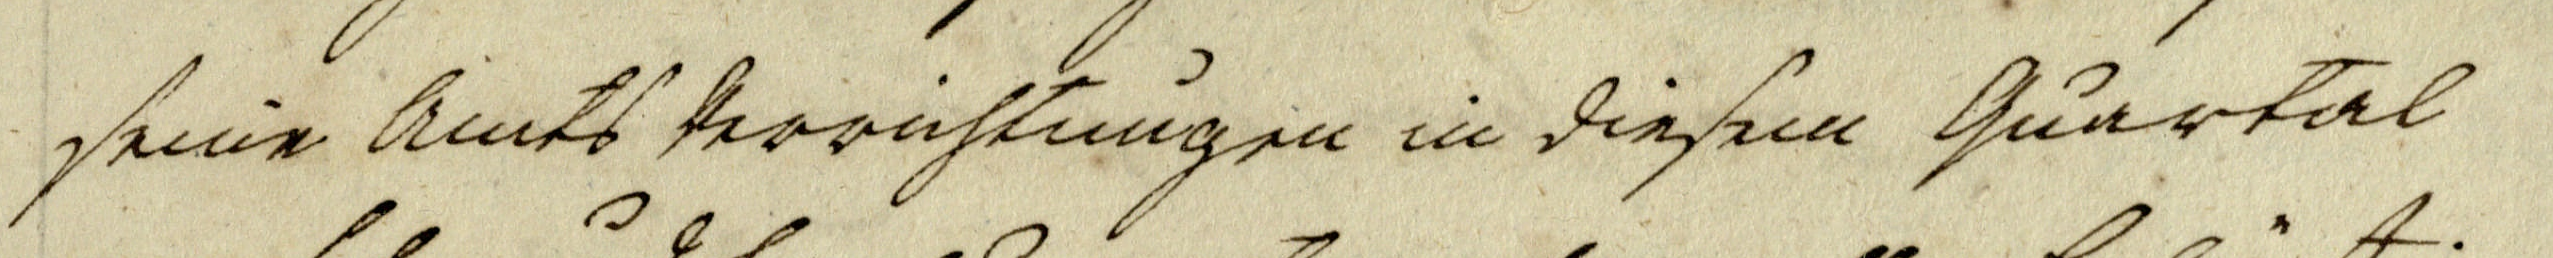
seine Amts Verrichtungen in diesem Quartal
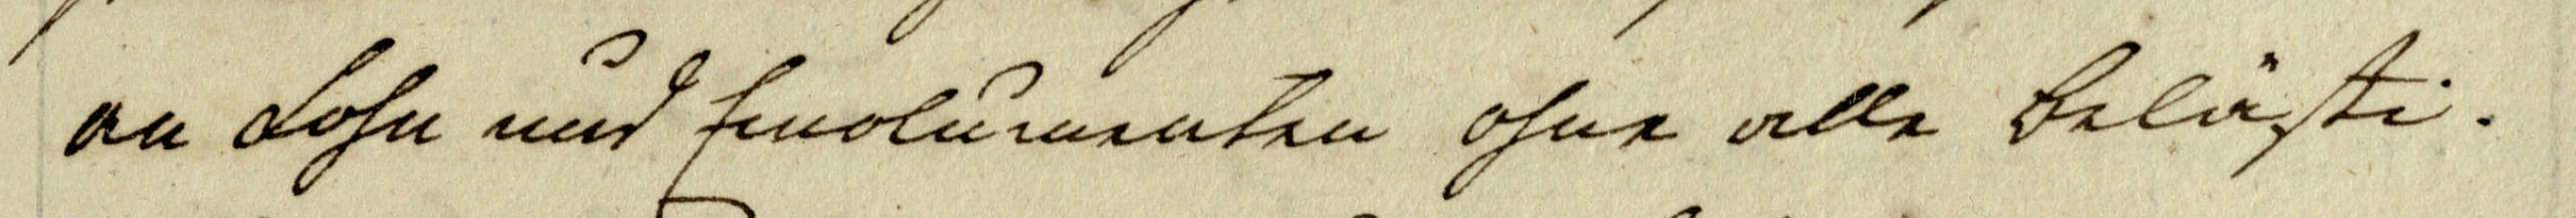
an Lohn und Emolumenten ohne alle Belästi¬.
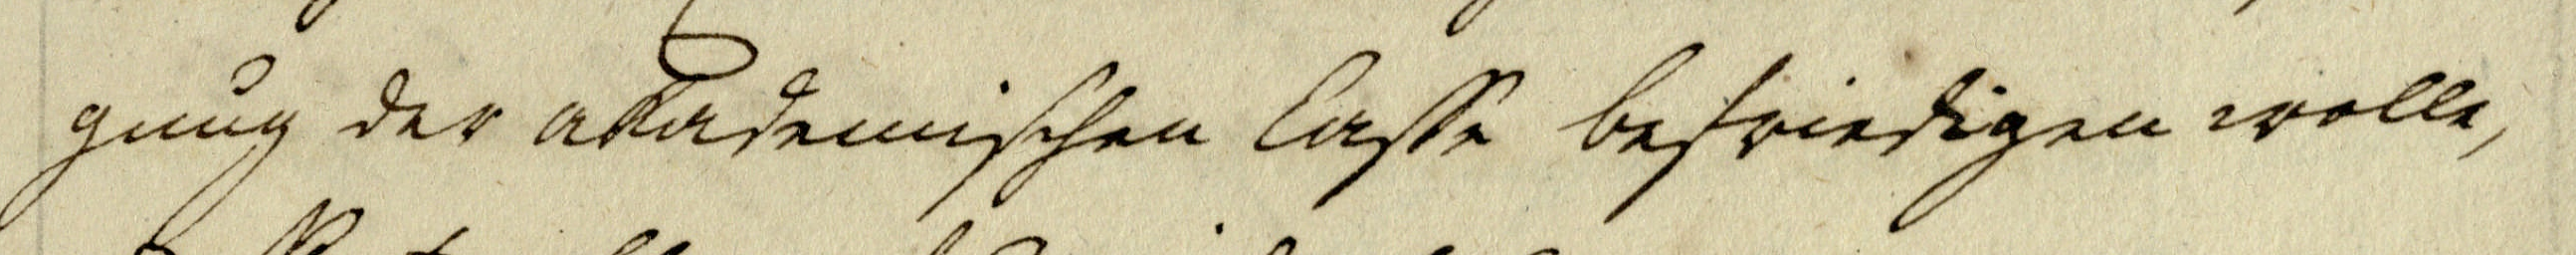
gung der akademischen Casse befriedigen wolle,
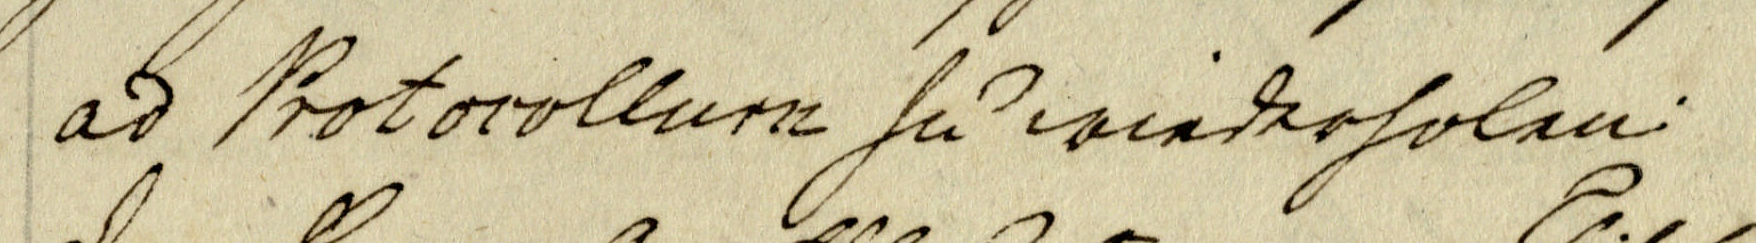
ad Protocollum zu wiederholen:
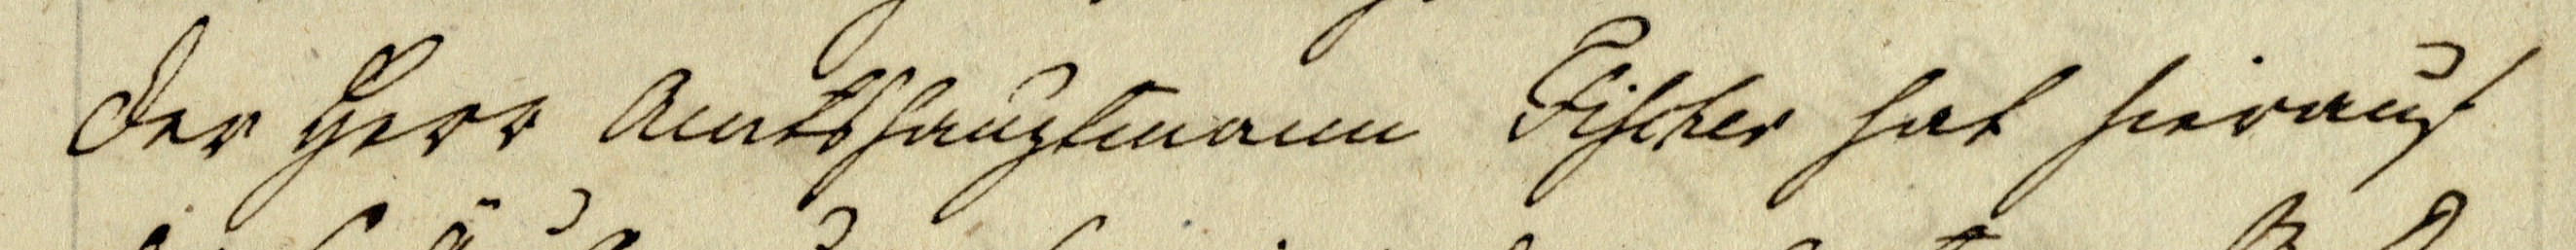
Der Herr Amtshauptmann Fischer hat hierauf
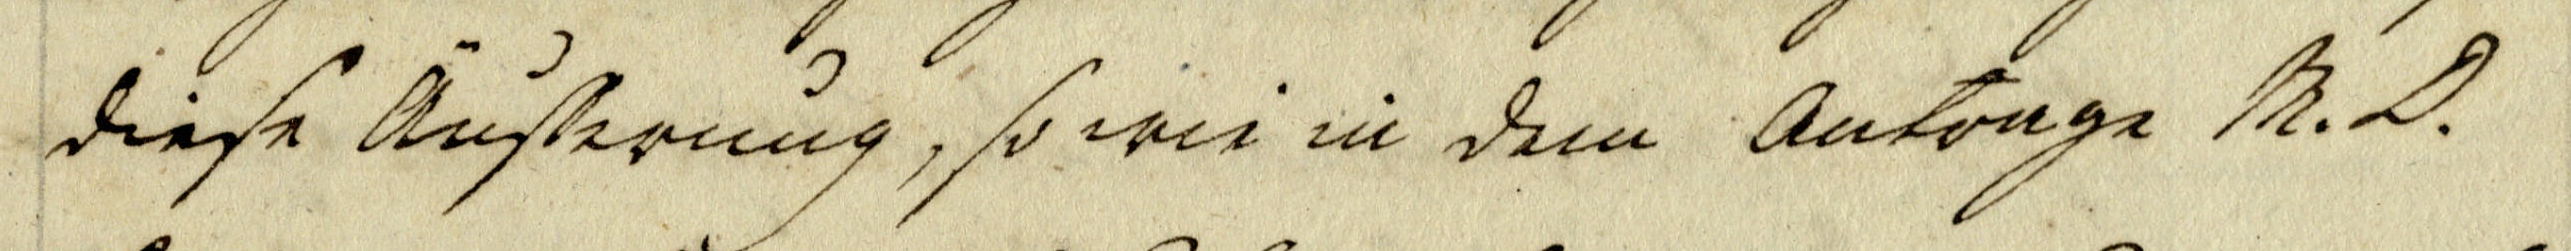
diese Äusserung, so wie in dem Antrage M. D.
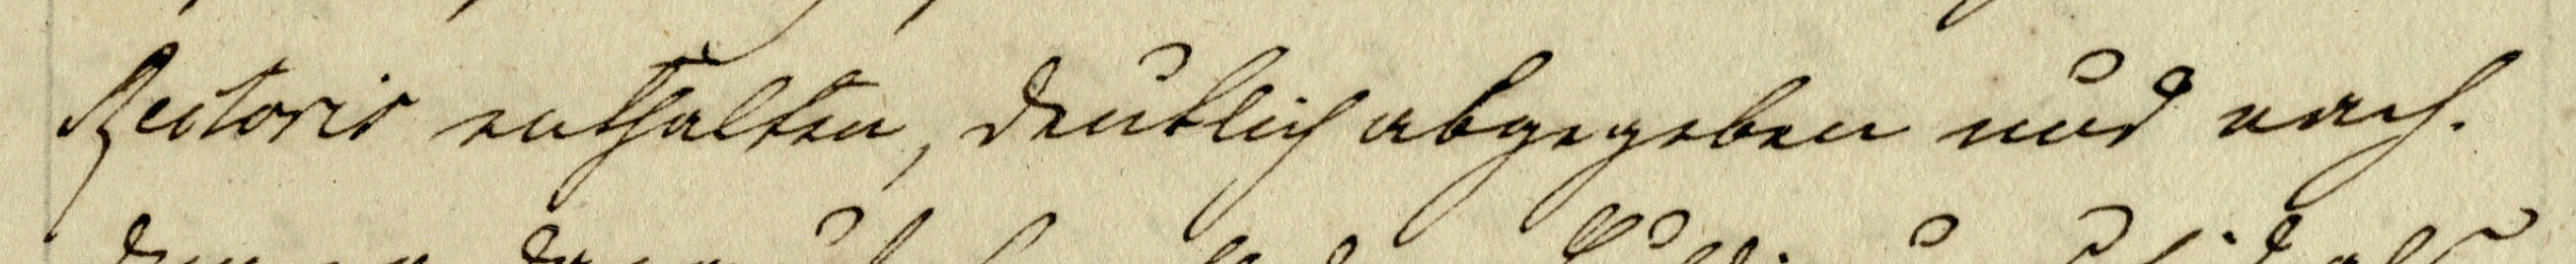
Rectoris enthalten, deutlich abgegeben und nach¬
